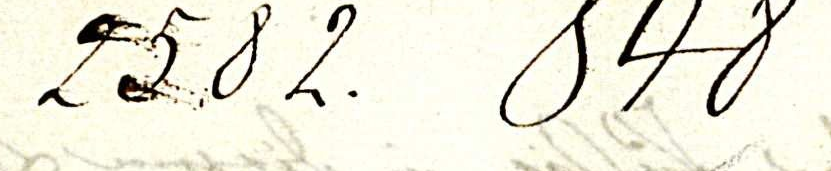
2582 848
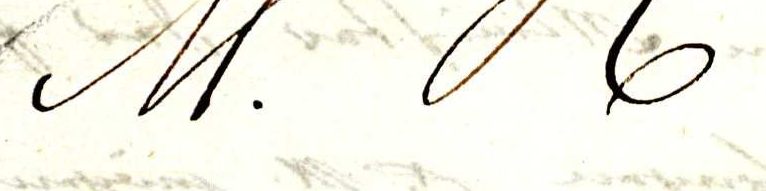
MR
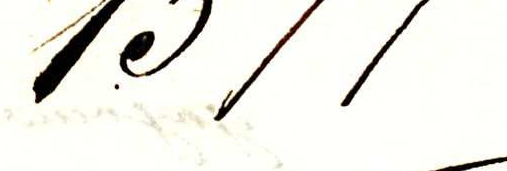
1577
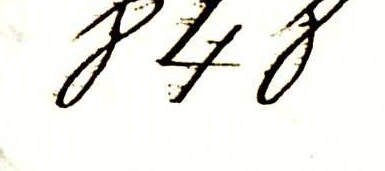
848
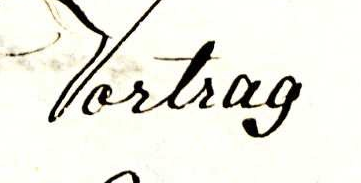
Vortrag
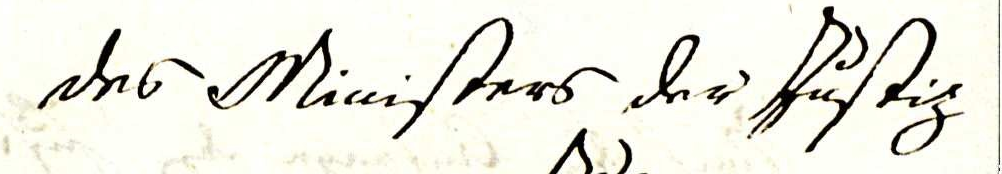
des Ministers der Justiz
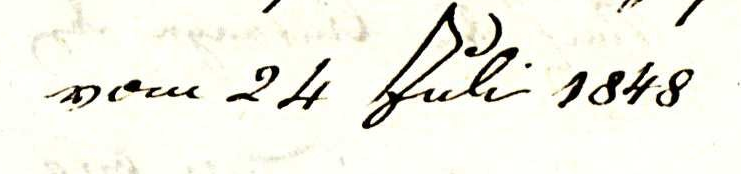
vom 24. Juli 1848
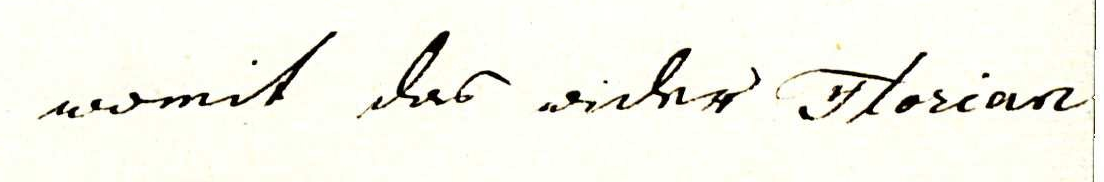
womit der wider Florian
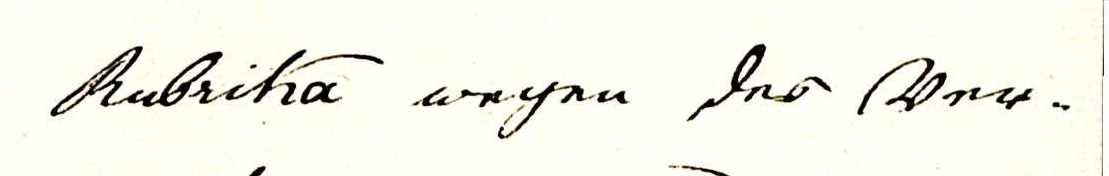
Rubrika wegen des Ver¬
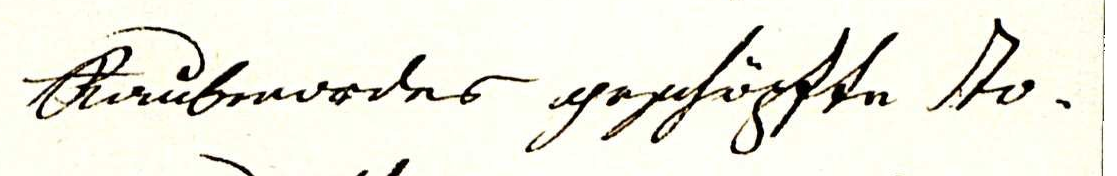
Raubmordes geschöpfte To¬
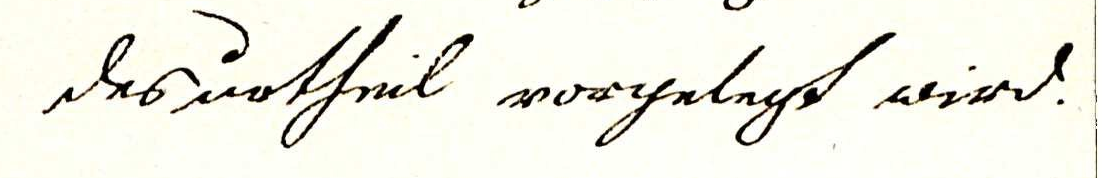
desurtheil vorgelegt wird.
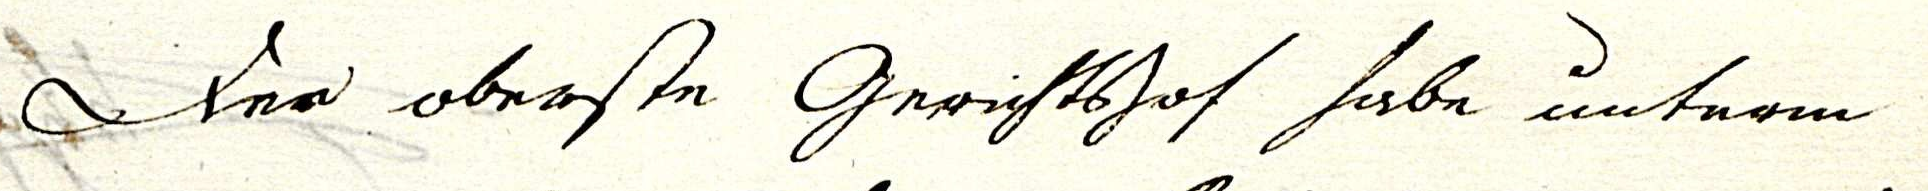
Der oberste Gerichtshof habe unterm
